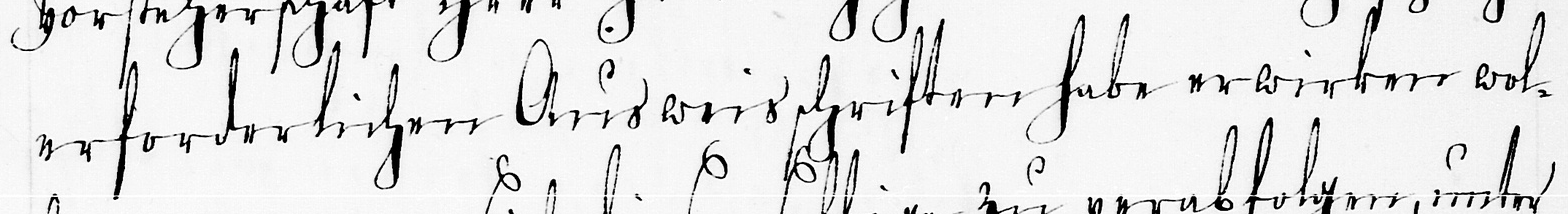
erforderlichen Ausweisschriften habe erwirken wol¬
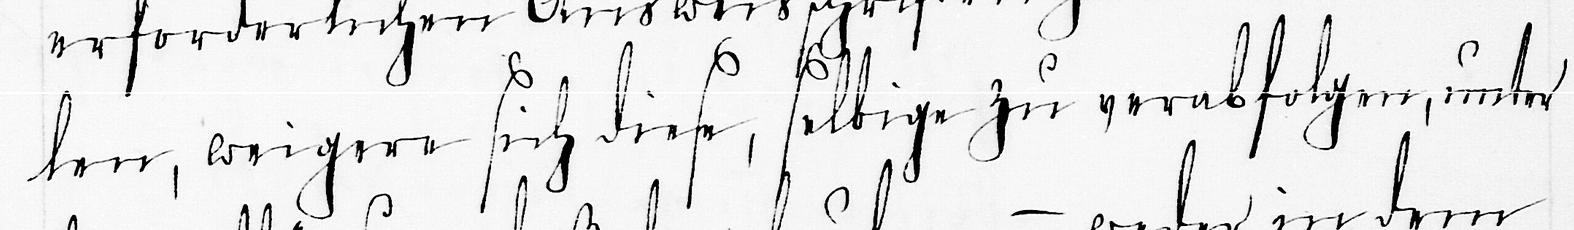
len, weigere sich diese, selbige zu verabfolgen, unter
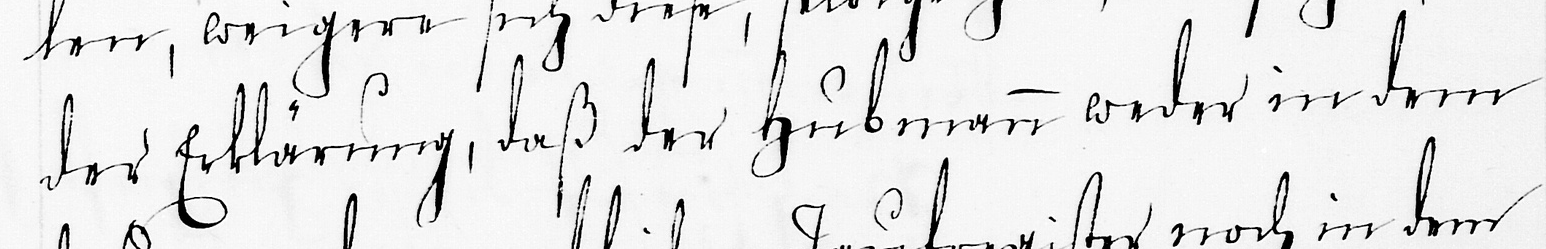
der Erklärung, daß der Hubmann weder in dem
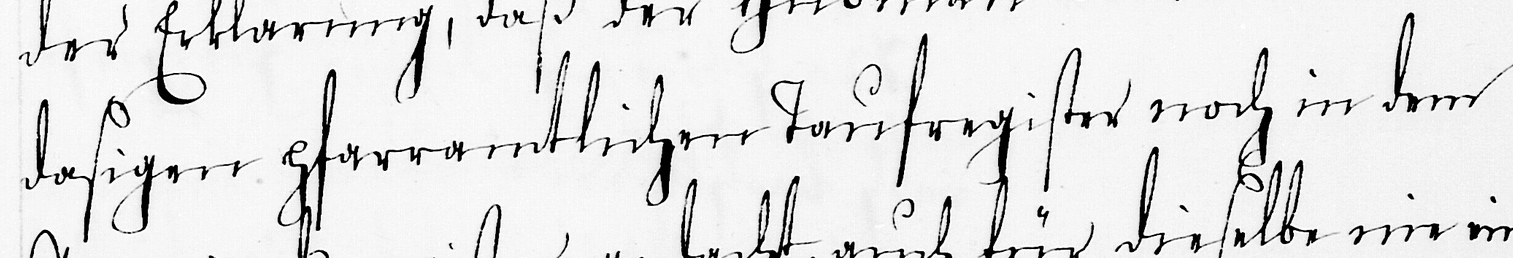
dasigen pfarramtlichen Taufregister noch in dem
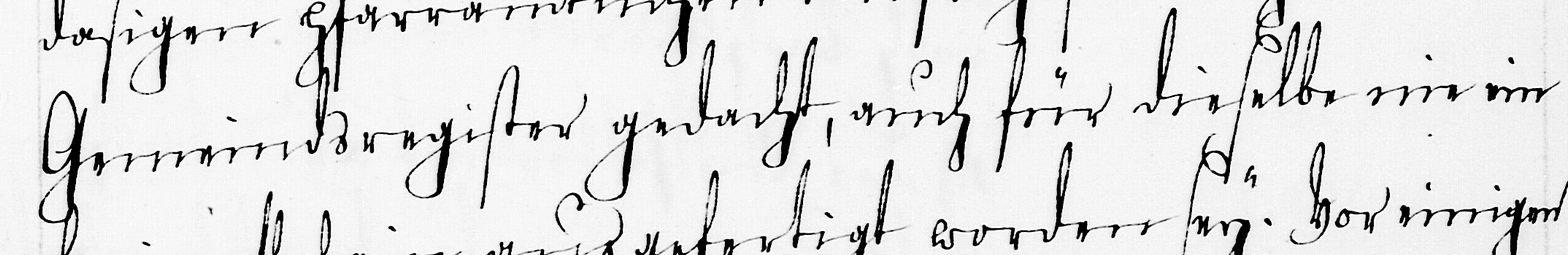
Gemeindsregister gedacht, auch für dieselbe nie ein
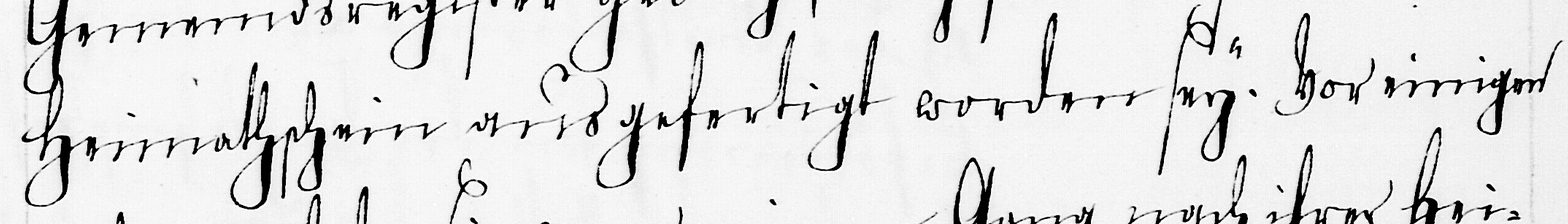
Heimathschein ausgefertigt worden sey. Vor einigen
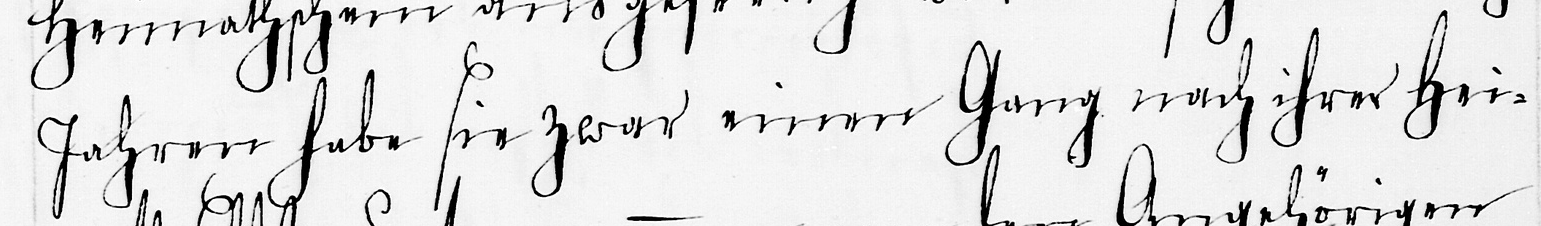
Jahren habe sie zwar einen Gang nach ihrer Hei¬
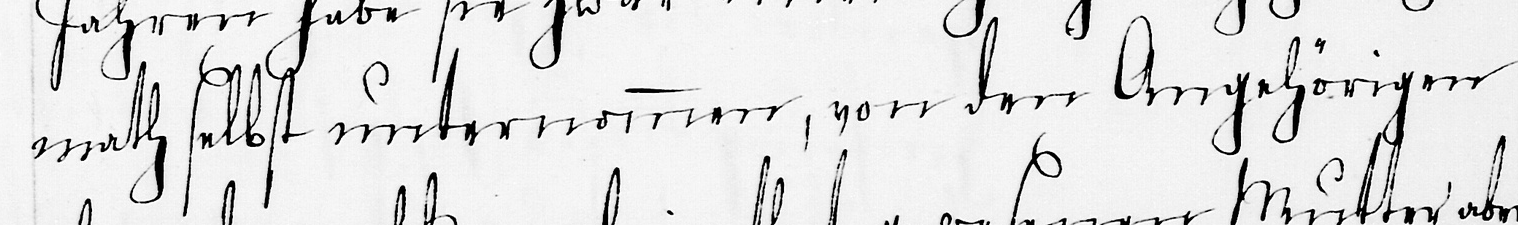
math selbst unternommen, von den Angehörigen
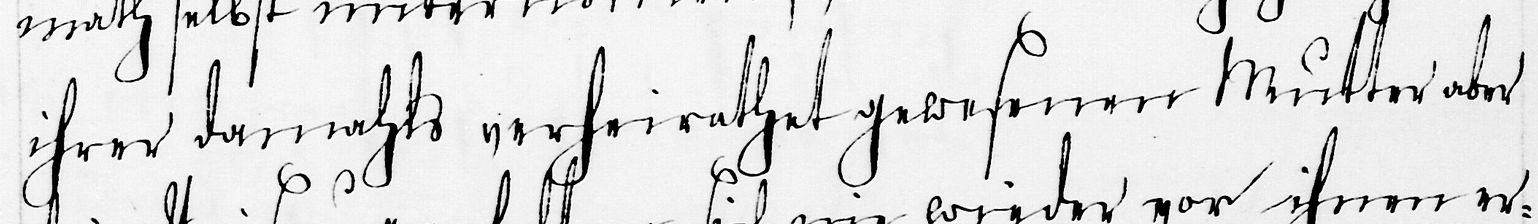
ihrer damahls verheirathet gewesenen Mutter aber
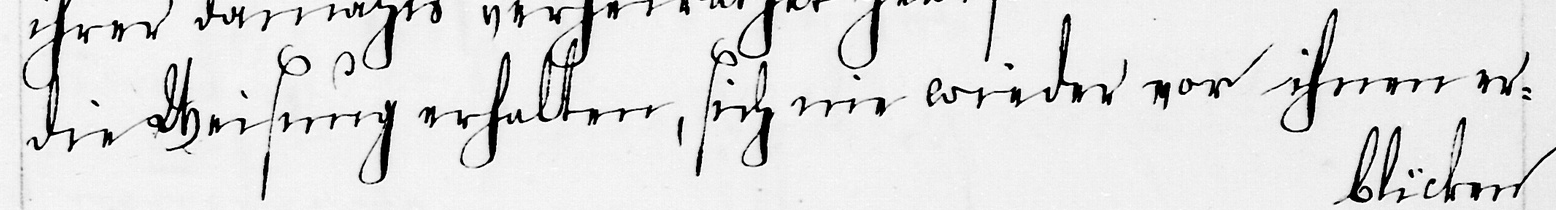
die Weisung erhalten, sich nie wieder vor ihnen er-
